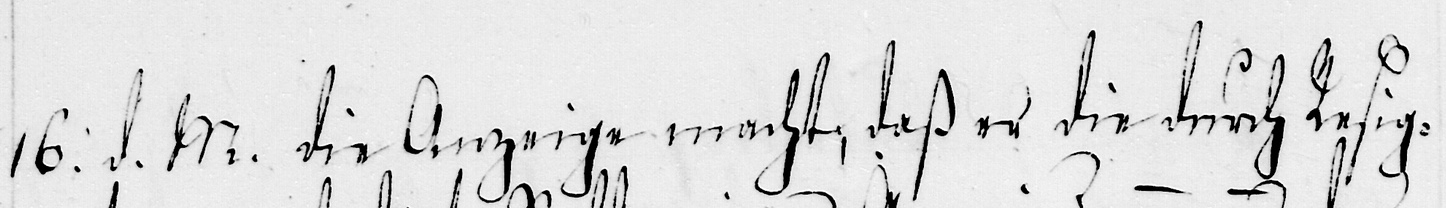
16. d. M. die Anzeige macht, daß er die durch Resig¬
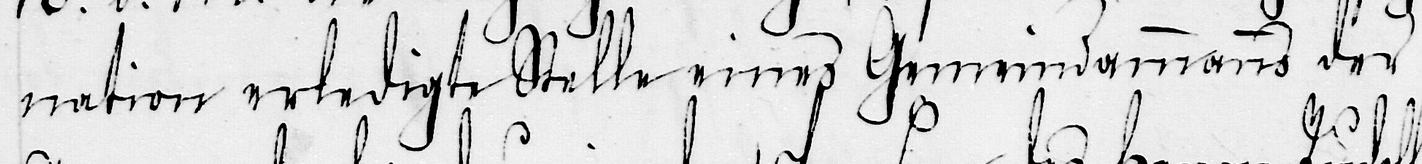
nation erledigte Stelle eines Gemeindammanns der
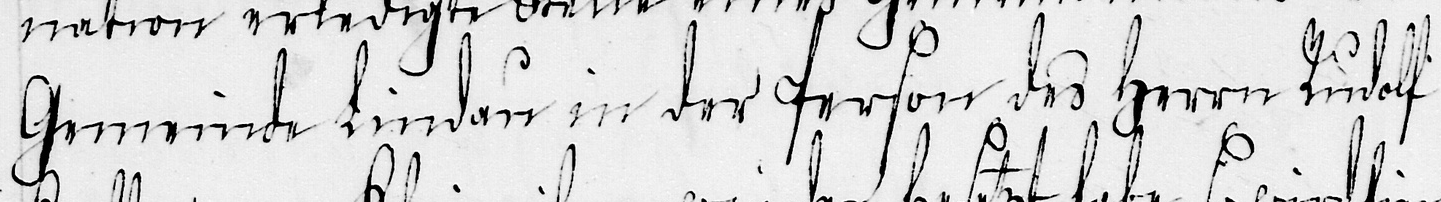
Gemeinde Lindau in der Person des Herrn Rudolf
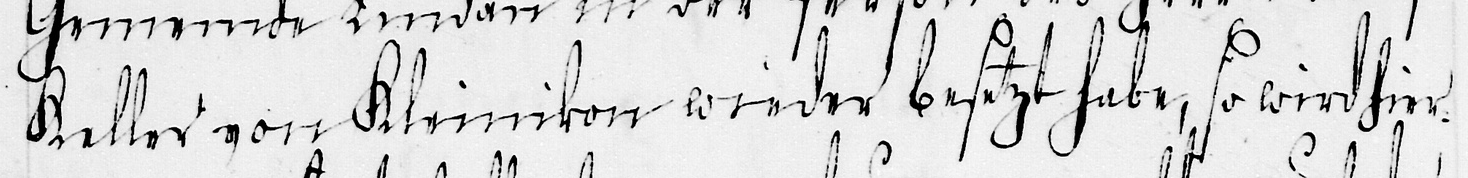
Keller von Kleinikon wieder besetzt habe, so wird hie¬
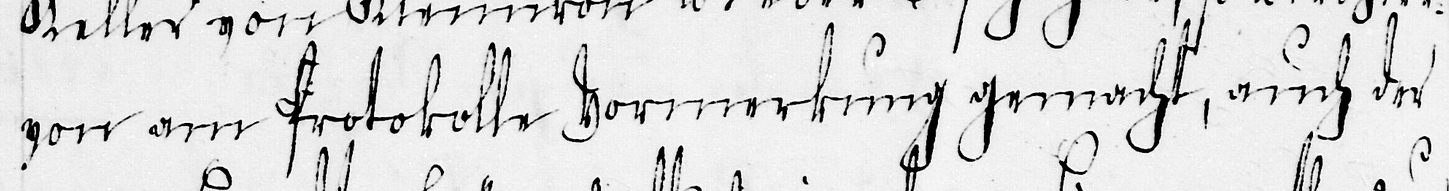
rvon am Protokolle Vormerkung gemacht, auch der
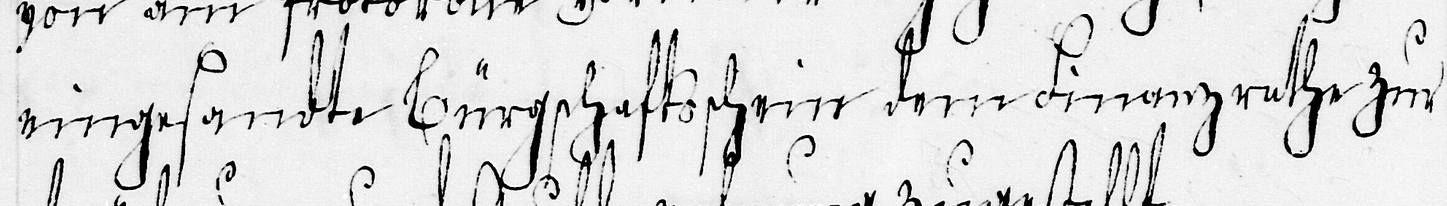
eingesandte Bürgschaftsschein dem Finanzrathe zur
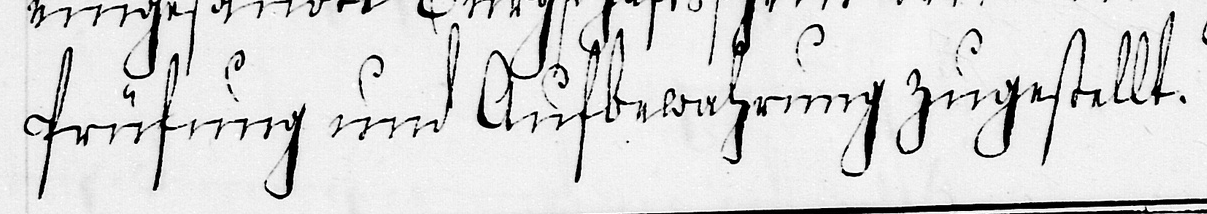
Prüfung und Aufbewahrung zugestellt.
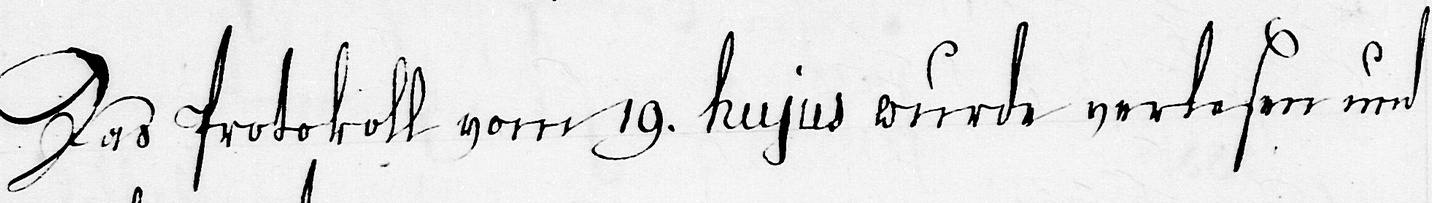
Das Protokoll vom 19. hujus wurde verlesen und
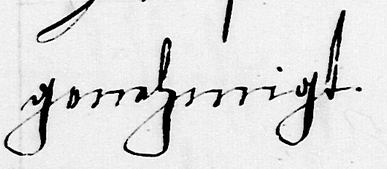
genehmigt.
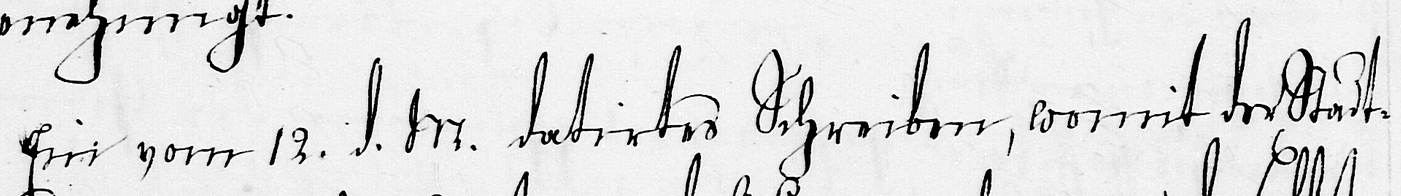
Ein vom 12. d. M. datirtes Schreiben, womit der Stadt¬
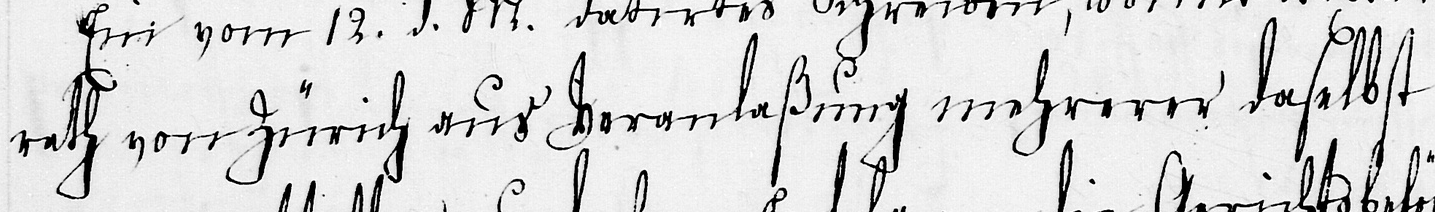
rath von Zürich aus Veranlaßung mehrerer daselbst
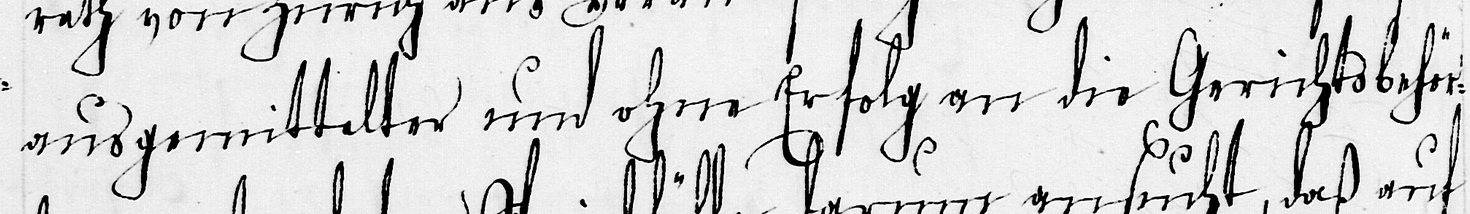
ausgemittelter und ohne Erfolg an die Gerichtsbehör¬
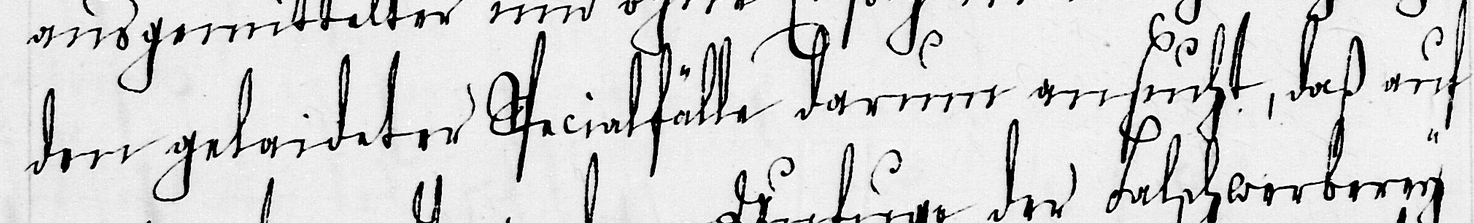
den gelaideter Specialfälle darum ansucht, daß auf
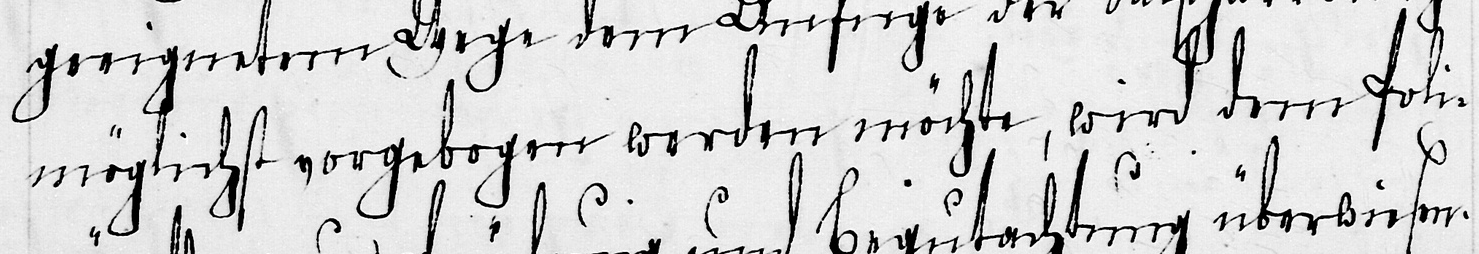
möglichst vorgebogen werden möchte, wird dem Poli¬
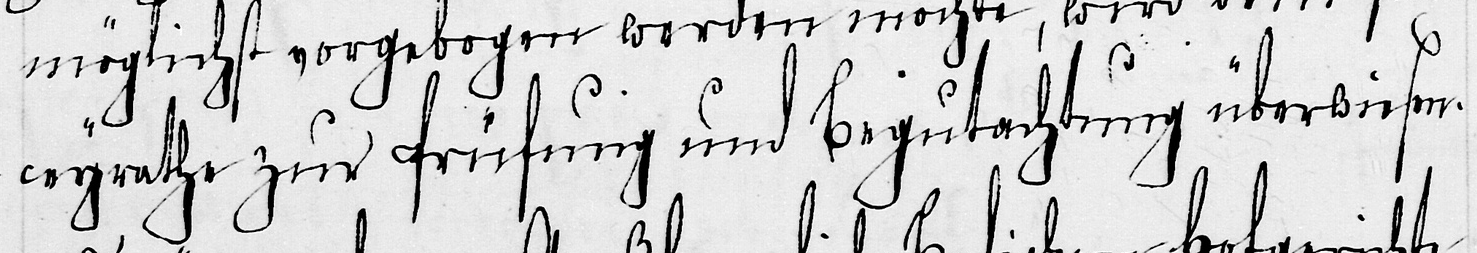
ceyrathe zur Prüfung und Begutachtung überwiesen.
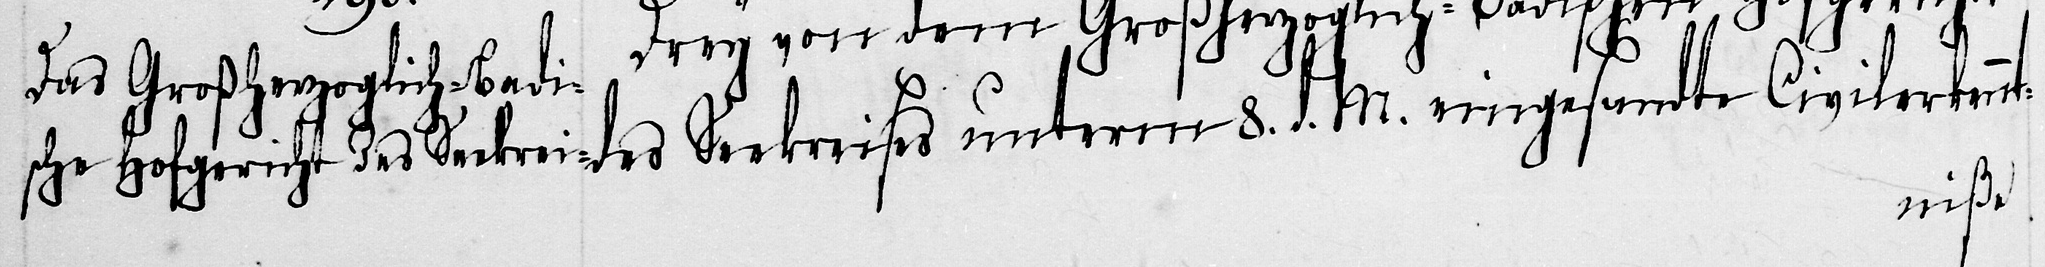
schen Hofgerichte des Seekreises unterm 8. d. M. eingesandte Civilerkennt-
